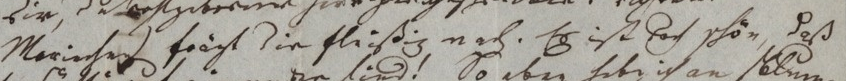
Mariechen frägt dir fleißig nach. Es ist doch schön, daß
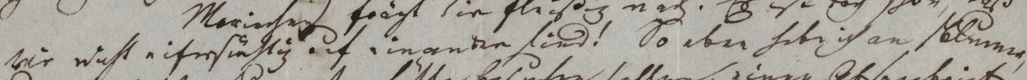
wir nicht eifersüchtig auf einander sind! So eben habe ich an Blumer,
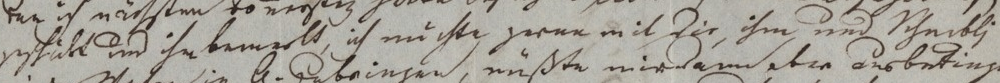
geschickt und ihm bemerkt, ich möchte gerne mit dir, ihm und Schnebli
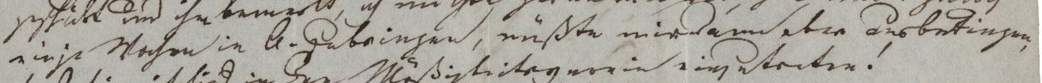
einje Wochen in A. zubringen, müßte mir dann aber ausbedingen,
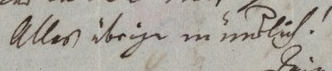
Alles übrige mündlich!
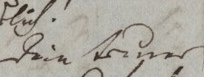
Dein treuer
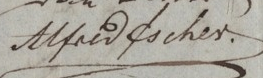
Alfred Escher.
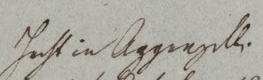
Hecht in Appenzell.
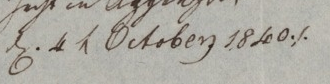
d. 4t October 1840./.
